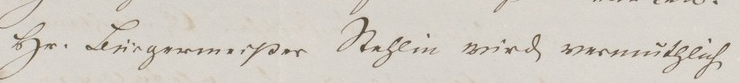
Hr. Bürgermeister Stehlin wird vermuthlich
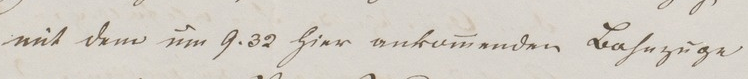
mit dem um 9.32 hier ankommenden Bahnzuge
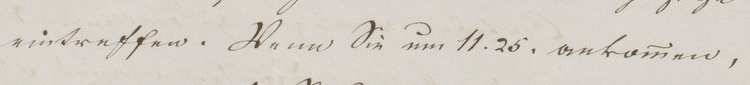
eintreffen. Wenn Sie 11.25. ankommen,
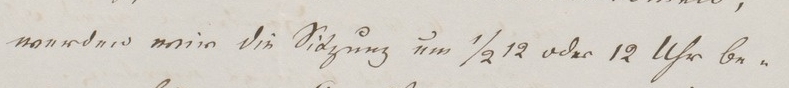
werden wir die Sitzung um ½ 12 oder 12 Uhr be-
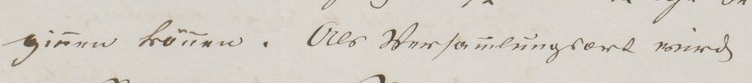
ginnen können. Als Versammungsort wird
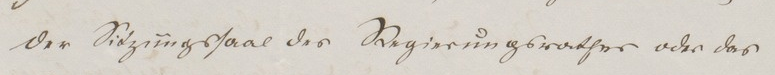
der Sitzungssaal des Regierungsrathes oder das
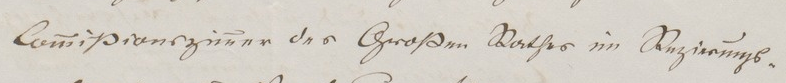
Commisionszimmer des Großen Rathes im Regierungs-
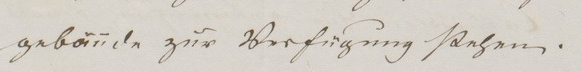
gebäude zur Verfügung stehen.
